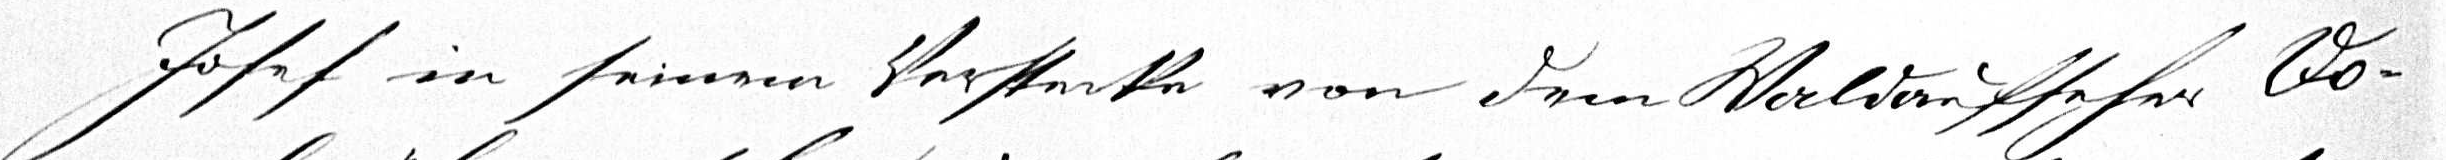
Josef in seinem Verstecke von dem Waldaufseher Vo¬
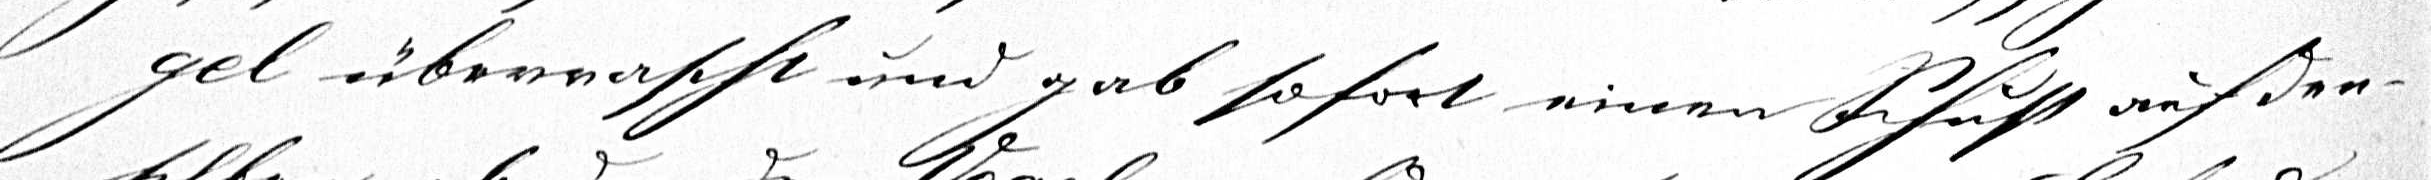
gel überrascht und gab sofort einen Schuß auf den¬
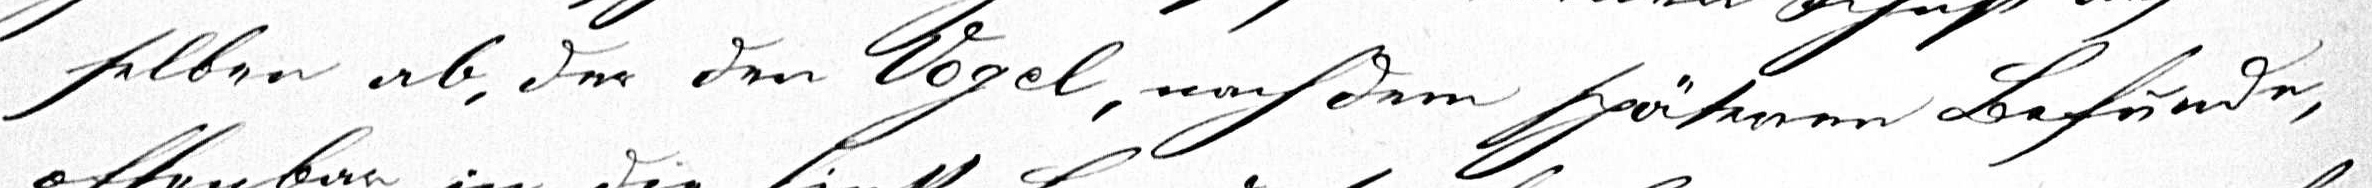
selben ab, der den Vogel, nach dem späteren Befunde,
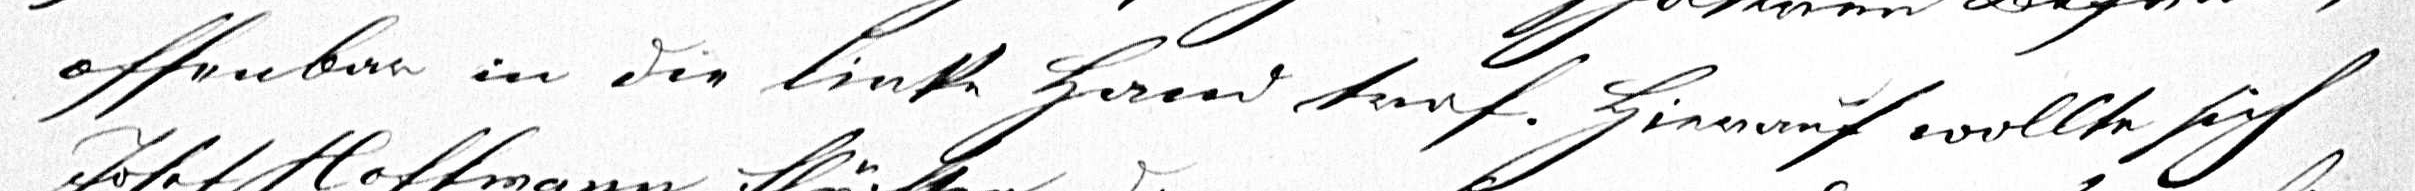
offenbar in die linke Hand traf. Hierauf wollte sich
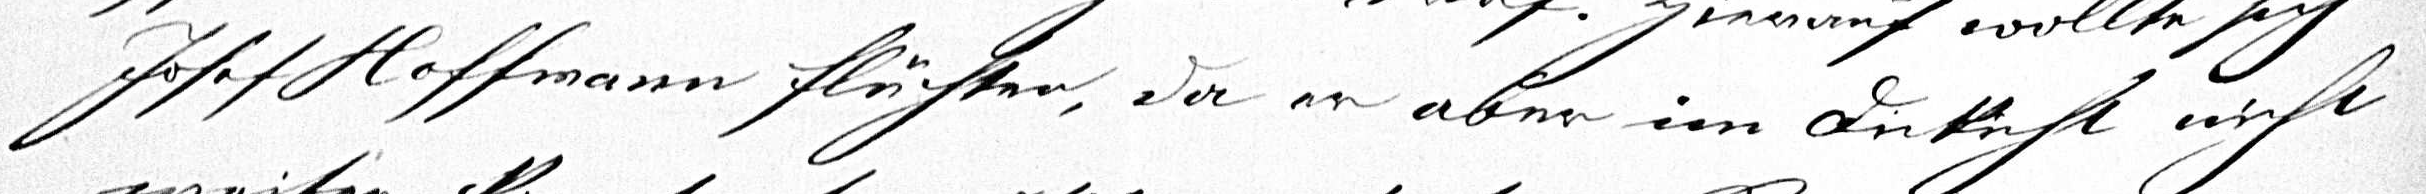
Josef Hoffmann flüchten, da er aber im Dickicht nicht
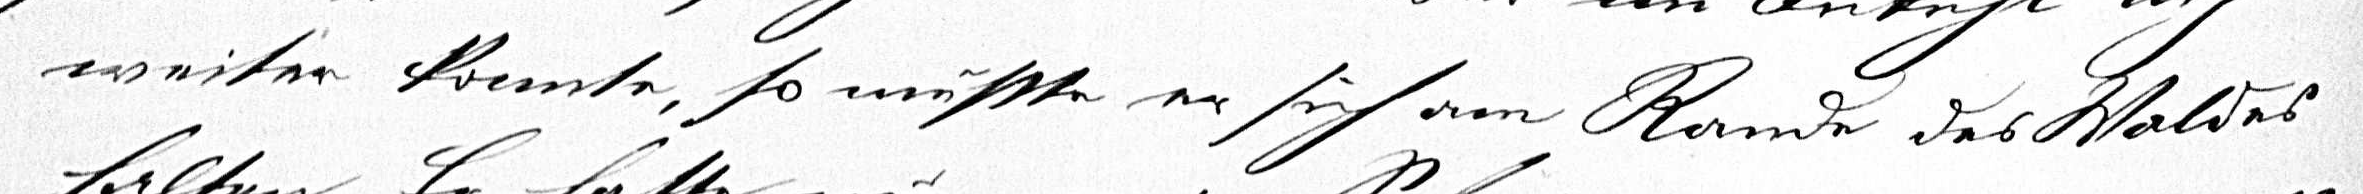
weiter konnte, so müßte er sich am Rande des Waldes
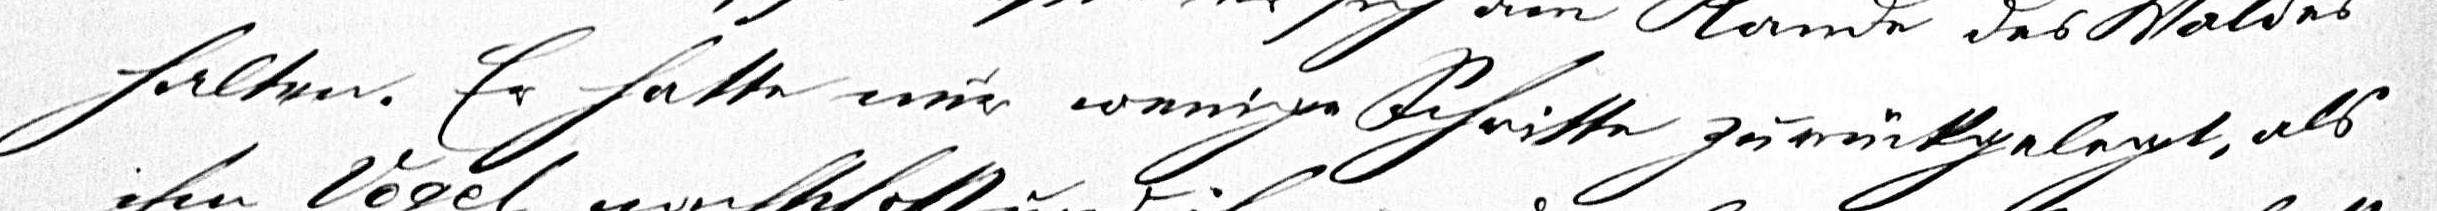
halten. Er hatte nur wenige Schritte zurückgelegt, als
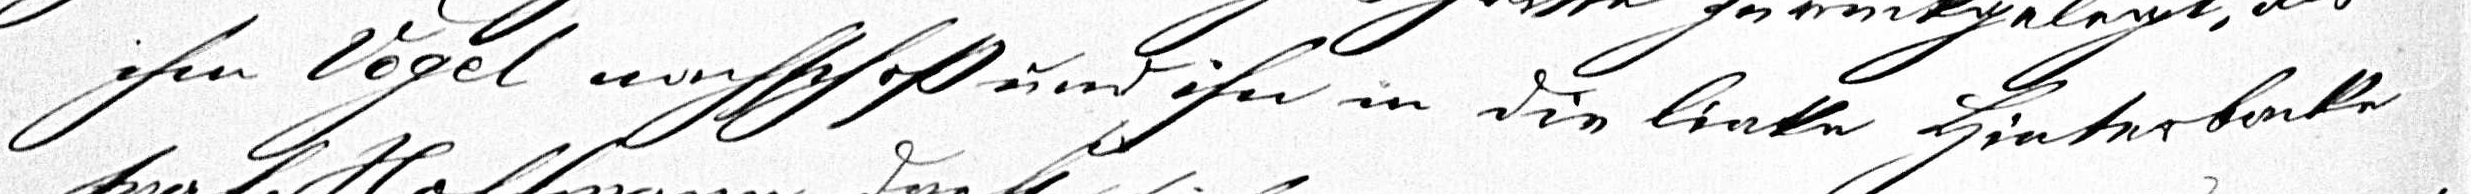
ihm Vogel nachschoß und ihn in die linke Hinterbacke
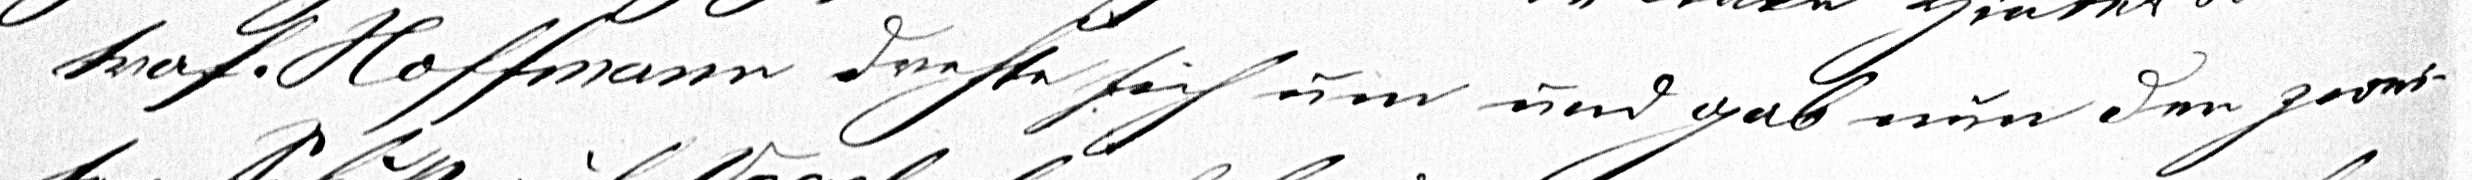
traf. Hoffmann drehte sich um und gab nun den zwei¬
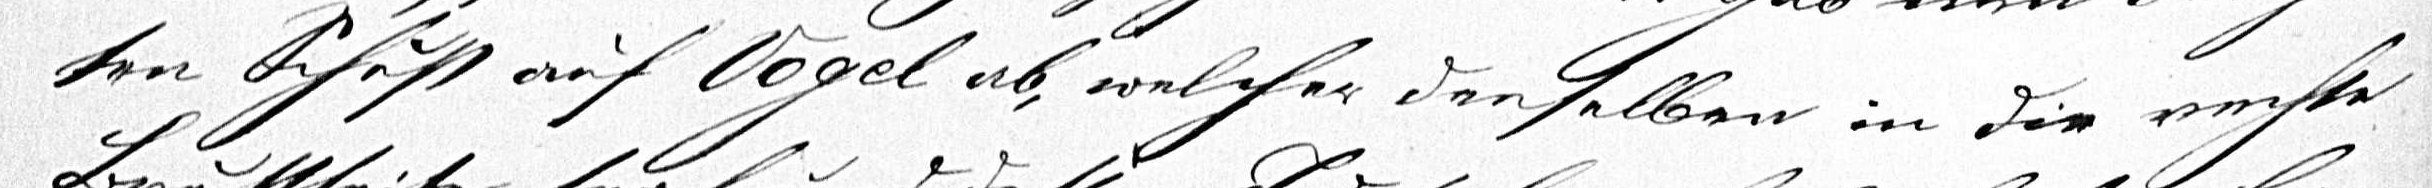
ten Schuß auf Vogel ab, welcher denselben in die rechte
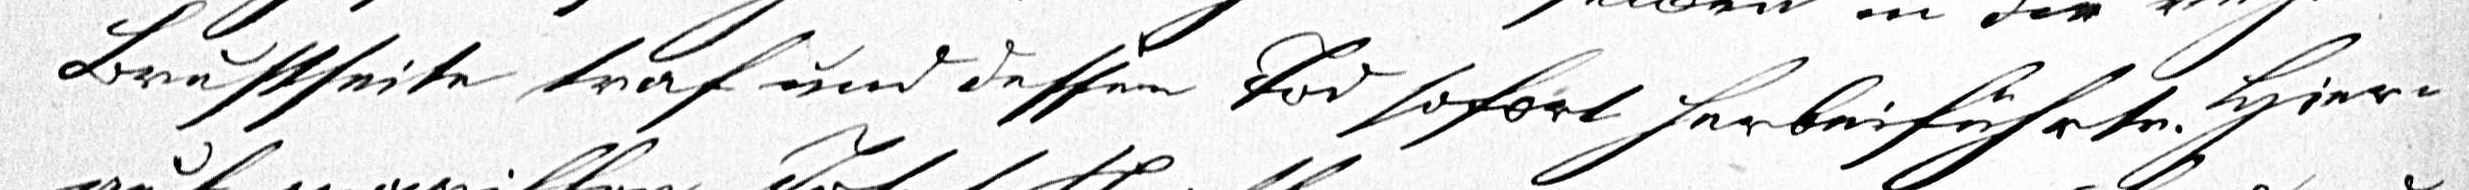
Brustseite traf und dessen Tod sofort herbeiführte. Hier¬
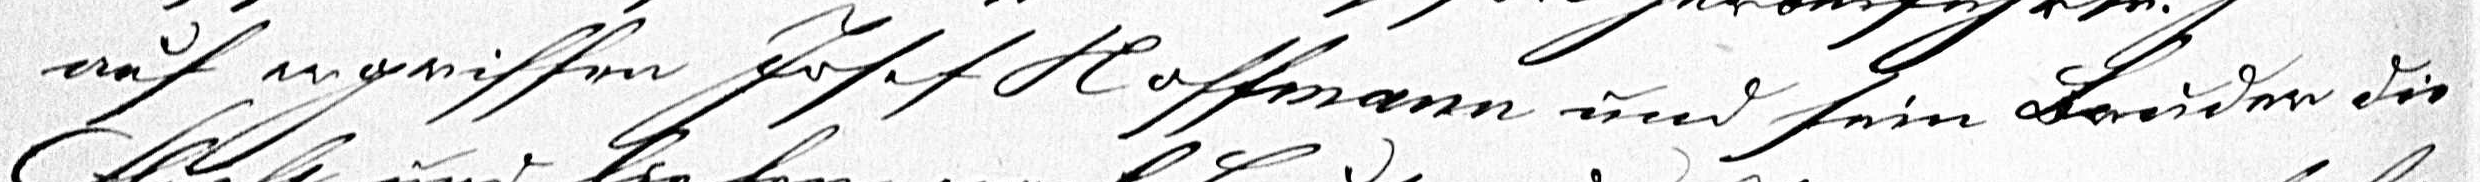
auf ergriffen Josef Hoffmann und sein Bruder die
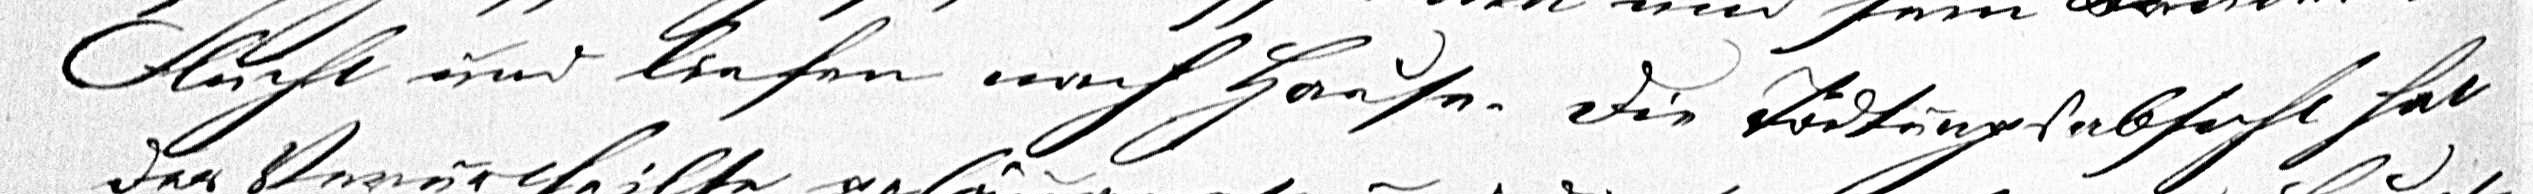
Flucht und liefen nach Hause. Die Tödtungsabsicht hat
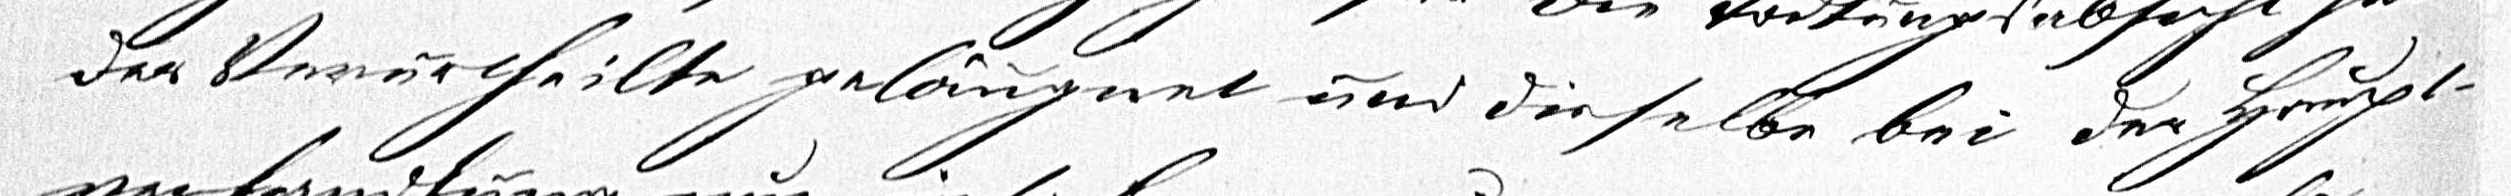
der Verurtheilte geläugnet und dieselbe bei der Haupt¬
